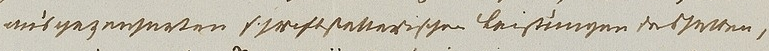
ausgezeichneten schriftstellerischen Leistungen desselben,
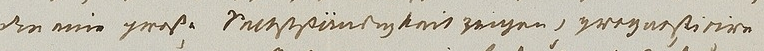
die eine große Selbstständigkeit zeigen, prognosticire
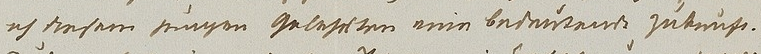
ich diesem jungen Gelehrten eine bedeutende Zukunft.
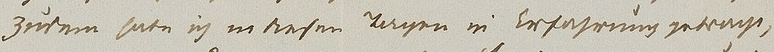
Zudem habe ich in diesen Tagen in Erfahrung gebracht,
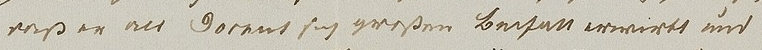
daß er als Docent sich großen Beifall erwirkt und
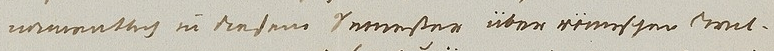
namentlich in diesem Semester über römischen Civil-
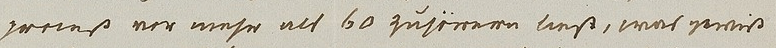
proceß vor mehr als 60 Zuhörern liest, was gewiß
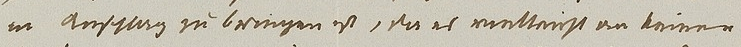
in Anschlag zu bringen ist, da es vielleicht an keiner
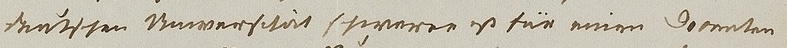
deutschen Universität schwerer ist für einen Docenten
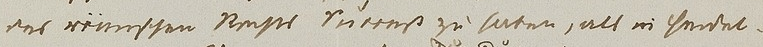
des römischen Rechts Succeß zu haben, als in Heidel-
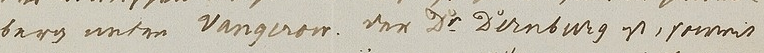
berg unter Vangerow. Der DrDernburg ist, soweit
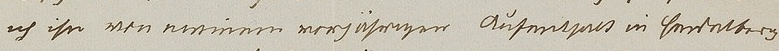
ich ihn von meinem vorjährigen Aufenthalt in Heidelberg
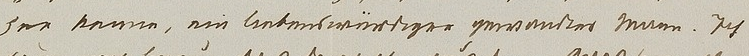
her kenne, ein liebenswürdiger gewandter Mann. Ich
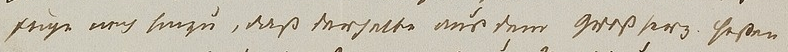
füge noch hinzu, daß derselbe aus dem Großherz. Heßen
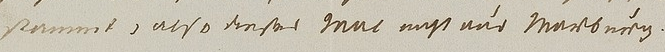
stammt, also dieses Mal nicht aus Marburg.
